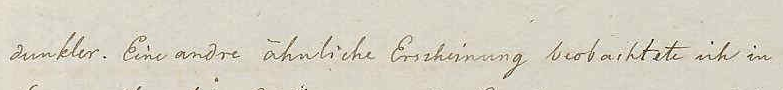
dunkler. Eine andre ähnliche Erscheinung beobachtete ich in
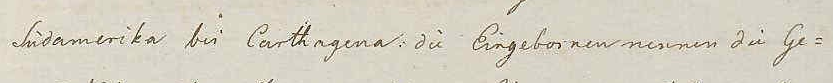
Südamerika bei Carthagena: die Eingebornen nennen die Ge-
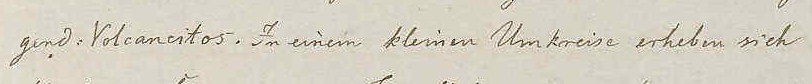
gend: Volcancitos. In einem kleinen Umkreise erheben sich
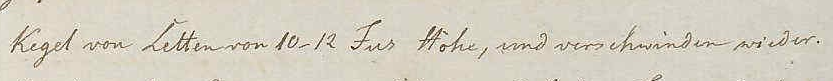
Kegel von Letten von 10–12 Fus Höhe, und verschwinden wieder.
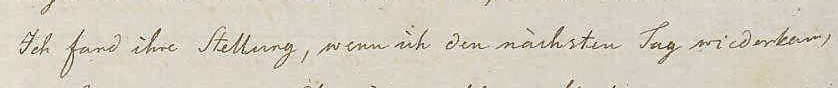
Ich fand ihre Stellung, wenn ich den nächsten Tag wiederkam,
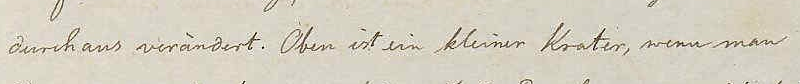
durchaus verändert. Oben ist ein kleiner Krater, wenn man
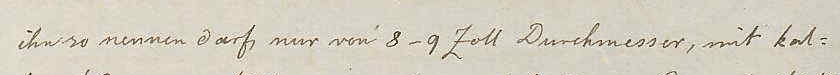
ihn so nennen darf, nur von 8–9 Zoll Durchmesser, mit kal-
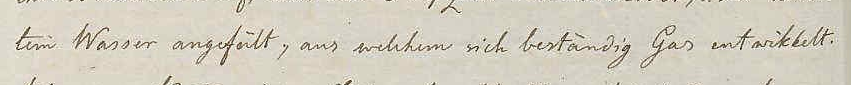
tem Wasser angefült, aus welchem sich beständig Gas entwikkelt.
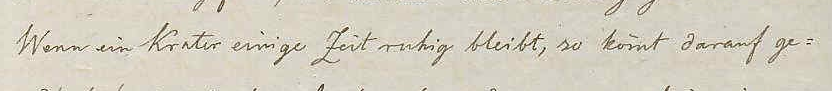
Wenn ein Krater einige Zeit ruhig bleibt, so kömt darauf ge-
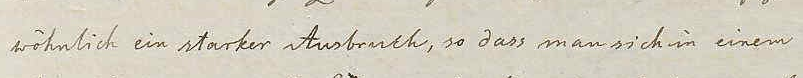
wöhnlich ein starker Ausbruch, so dass man sich in einem
